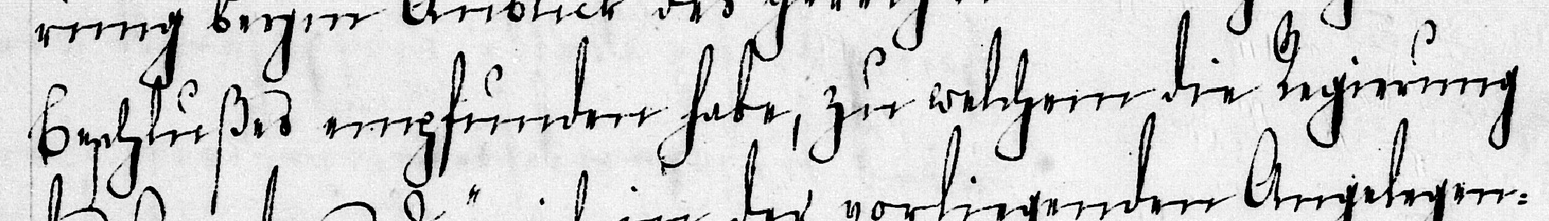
Beschlußes empfunden habe, zu welchem die Regierung
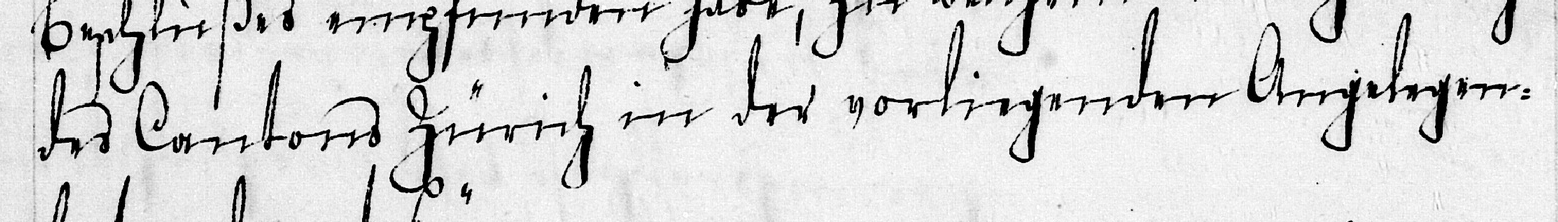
des Cantons Zürich in der vorliegenden Angelegen¬
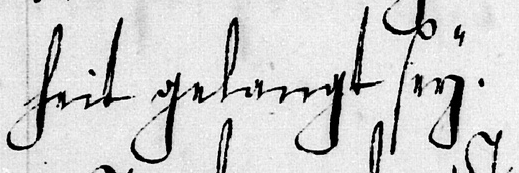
heit gelangt sey.
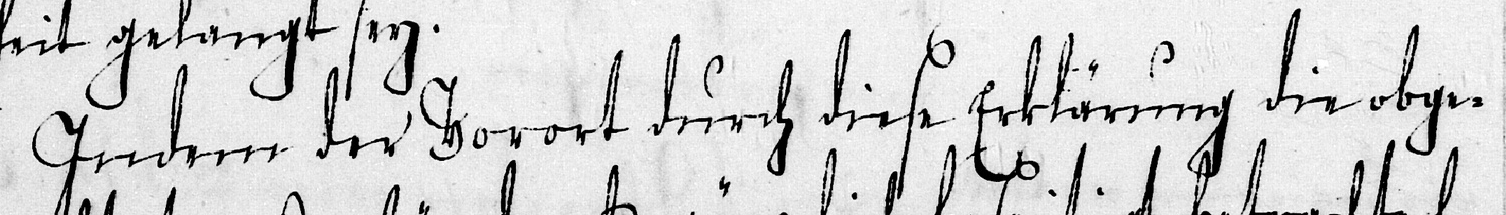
Indem der Vorort durch diese Erklärung die obge¬
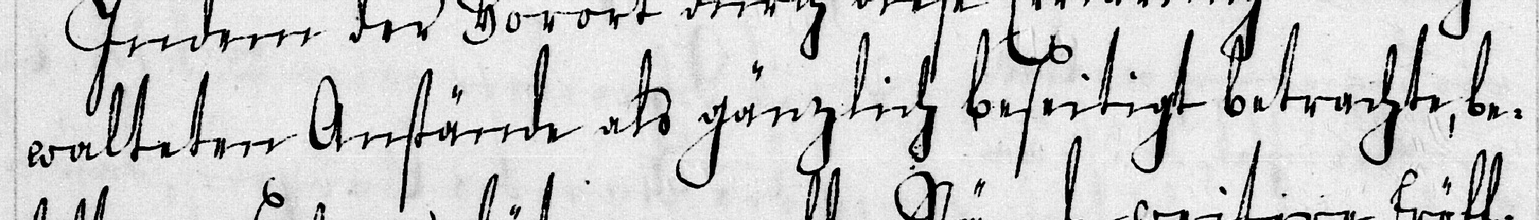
walteten Anstände als gänzlich beseitigt betrachte,
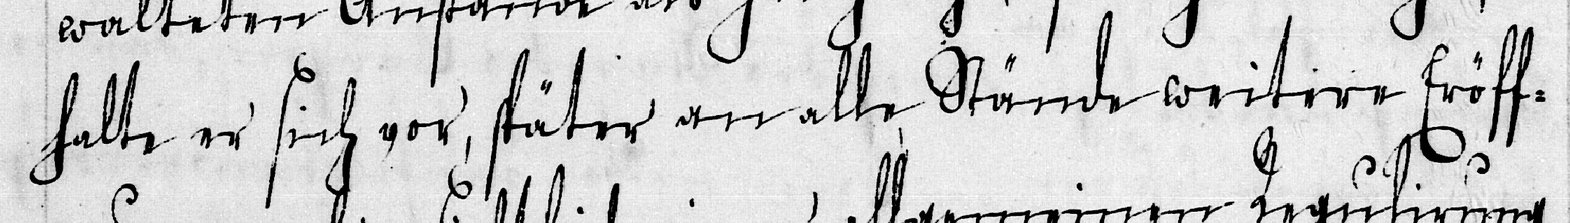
halte er sich vor, später an alle Stände weitere Eröff¬
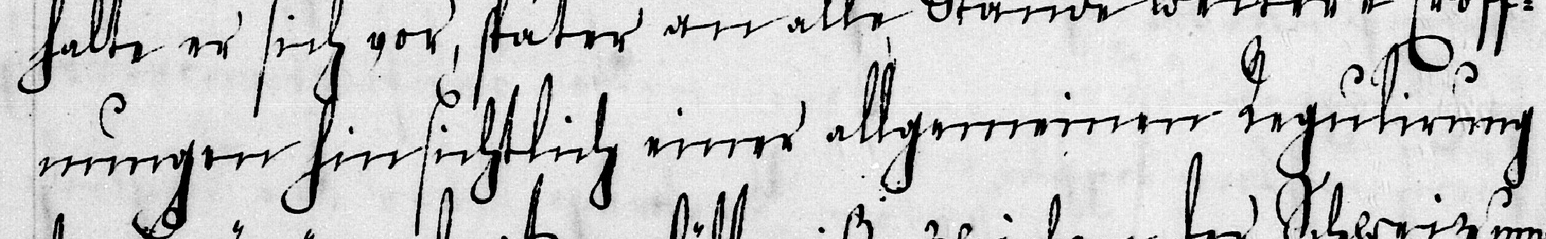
nungen hinsichtlich einer allgemeinen Regulirung
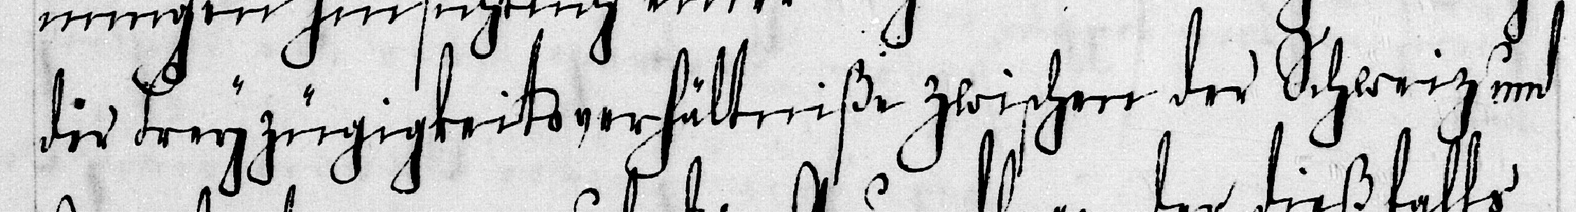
der Freyzügigkeitsverhältniße zwischen der Schweiz und
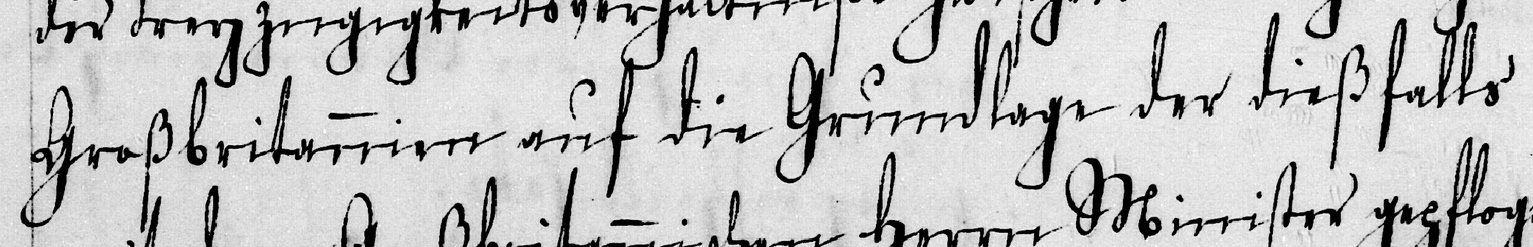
Großbritannien auf die Grundlage der dießfalls
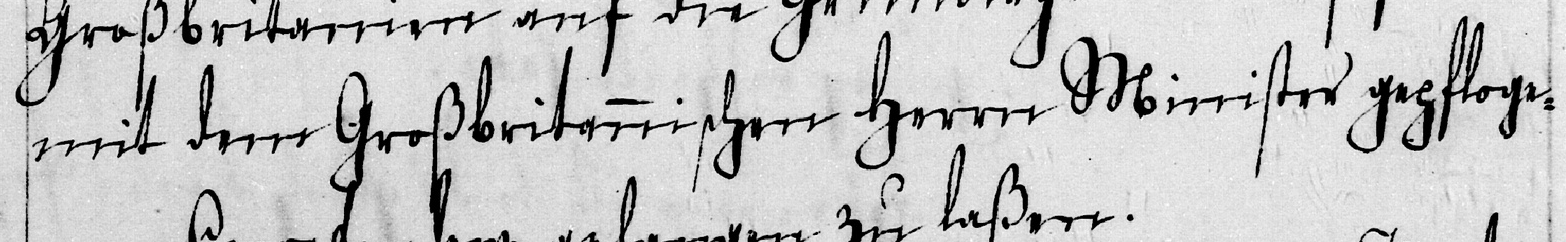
mit dem Großbritannischen Herrn Minister gepfloge¬
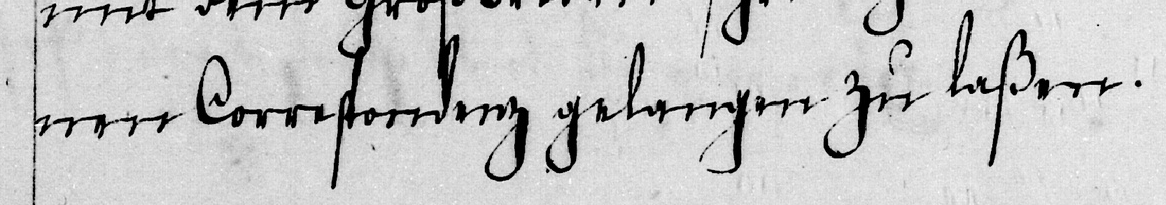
nen Correspondenz gelangen zu laßen.
